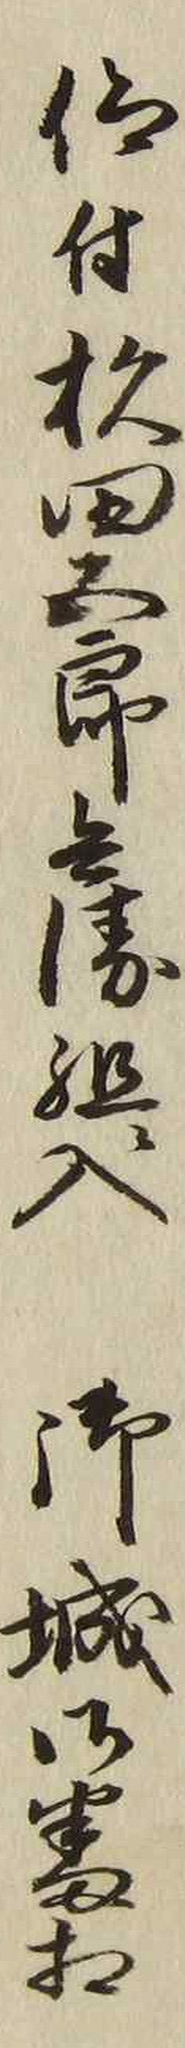仰付杉田五郎兵衛組ニ入御城御番相
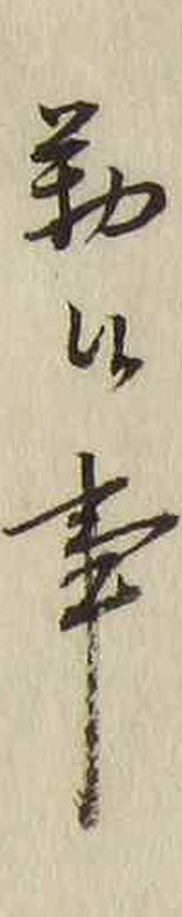勤候事

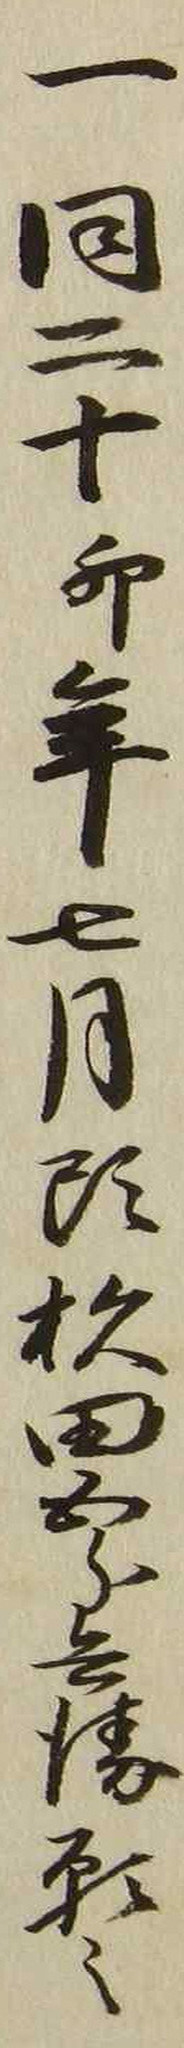一同二十卯年七月頭杉田五郎兵衛願之
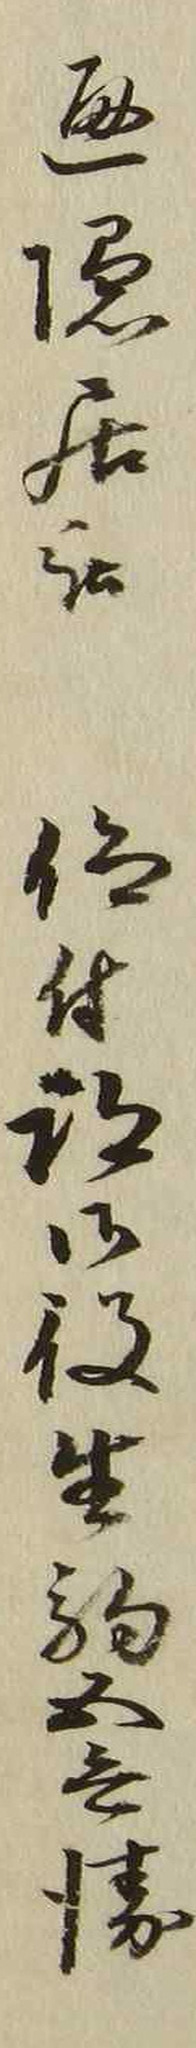通隠居被仰付跡御役生駒五兵衛
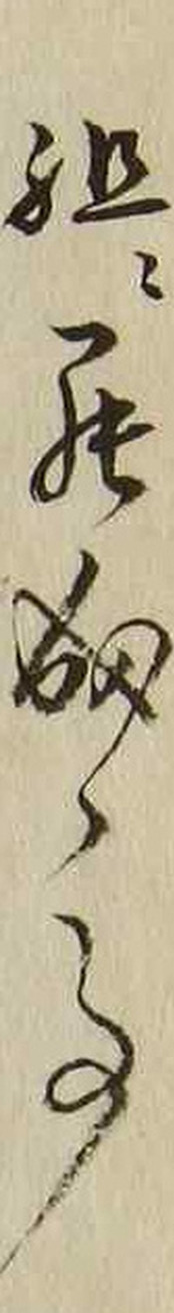組ニ罷成候事
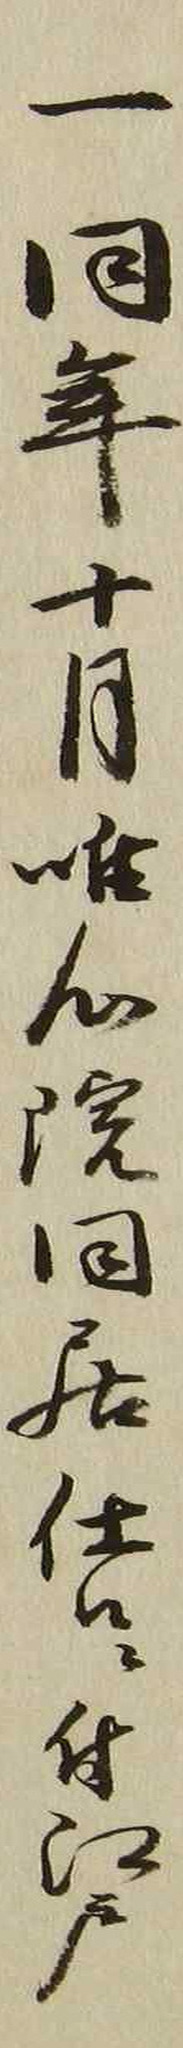一同年十月唯心院同居仕候ニ付江戸
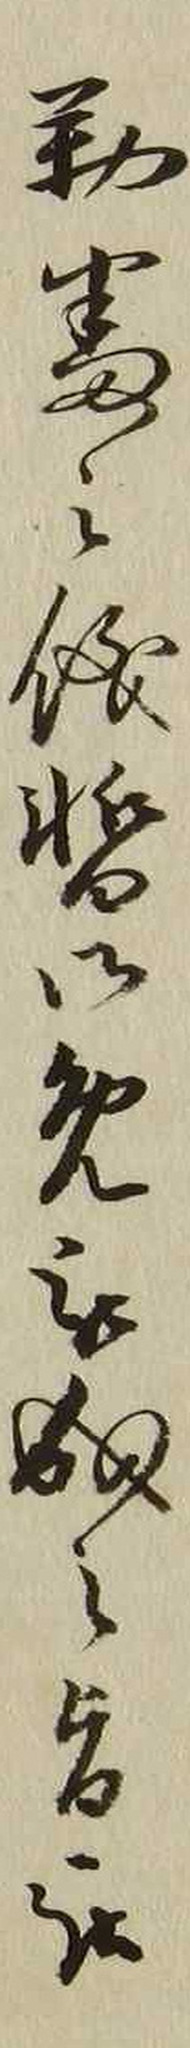勤番之儀暫御免被成之旨被
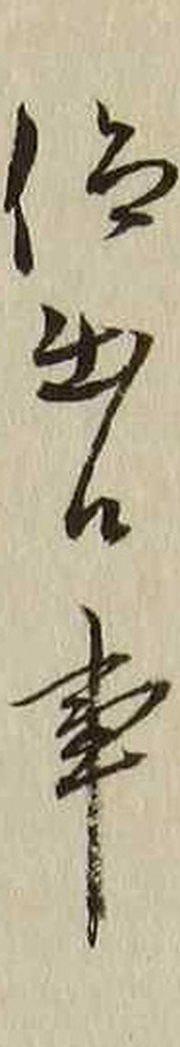仰出候事
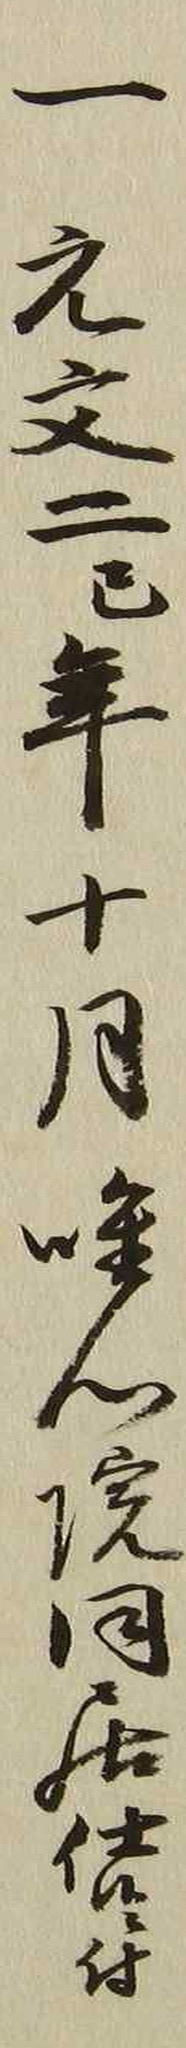一元文二巳年十月唯心院同居仕候ニ付
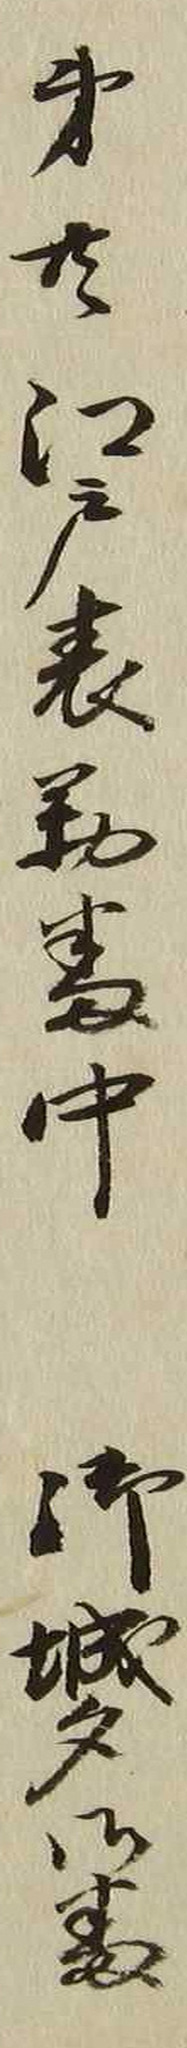弟共江戸表勤番中御城夕御番
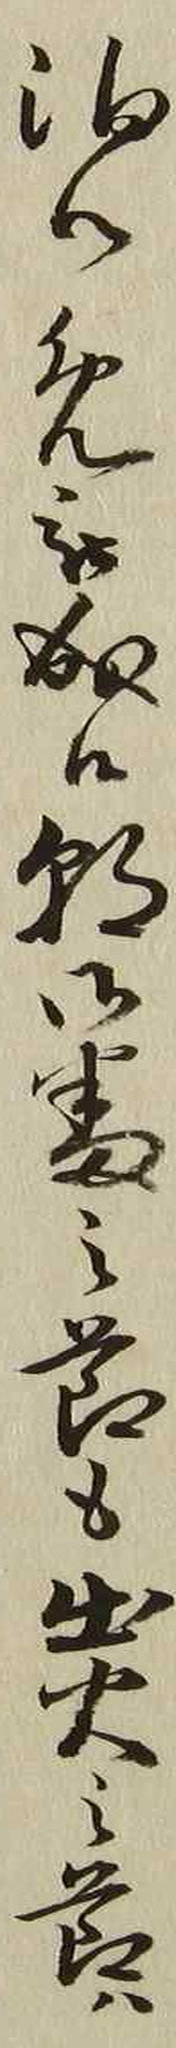泊御免被成候願御番之節も出火之節ハ
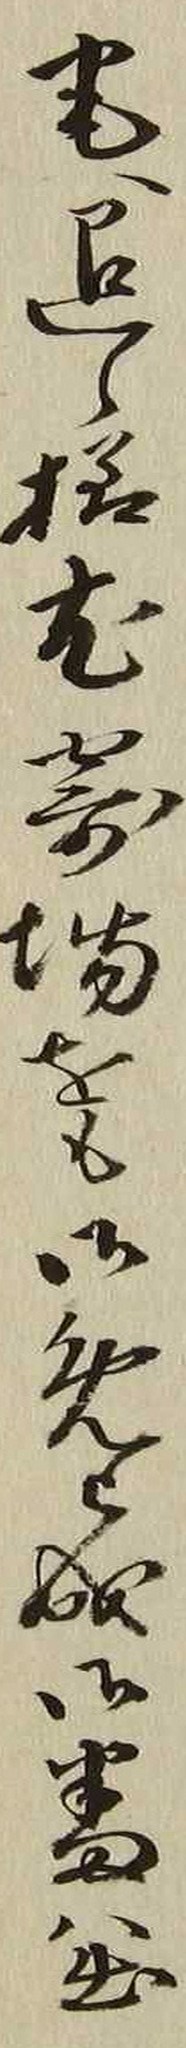宅へ退候様尤寄場をも御先被成御番ハ出
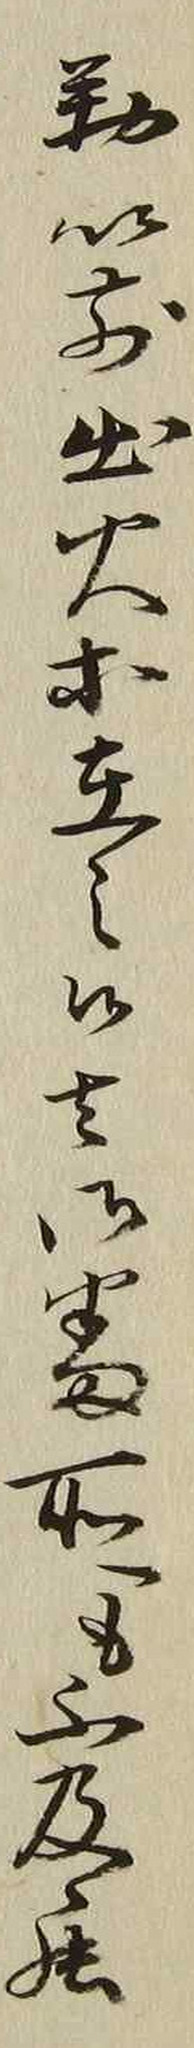勤以前出火等在之候者御番所へも不及罷
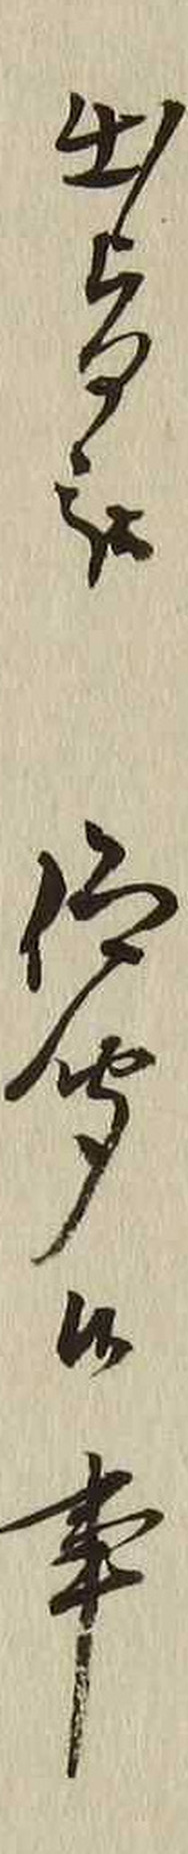出旨被仰聞候事
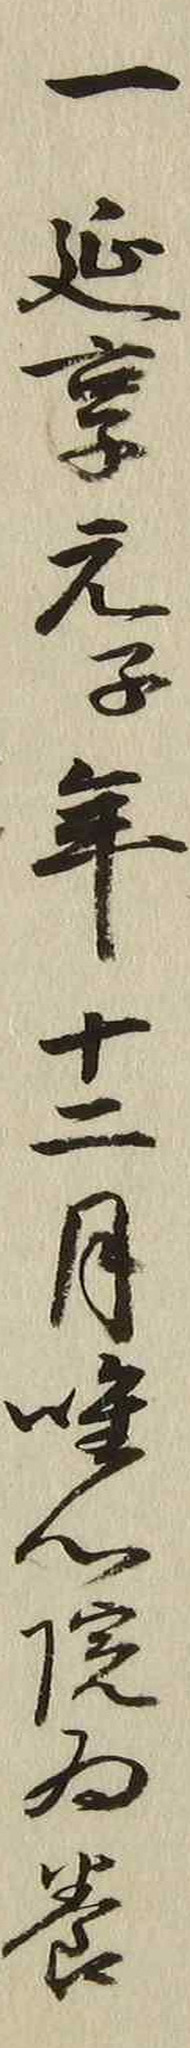一延享元子年十二月唯心院為養
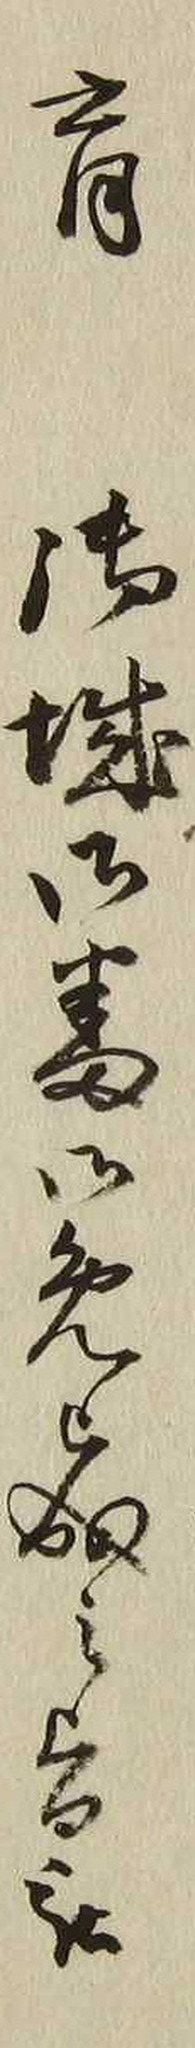育御城御番御免被成之旨被
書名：諸士系譜　巻之61　と之部4
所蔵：会津若松市立会津図書館
